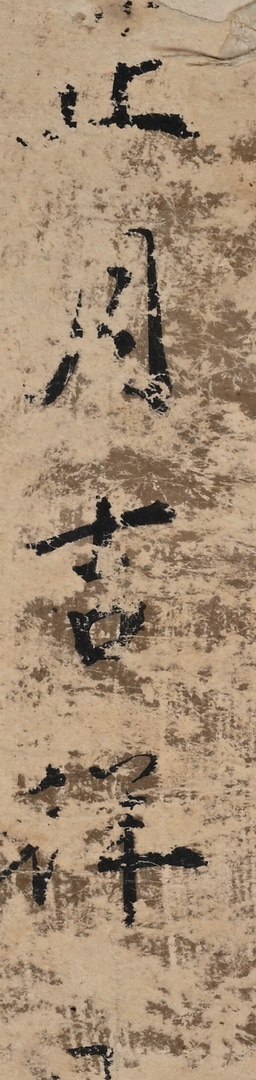正月吉祥日

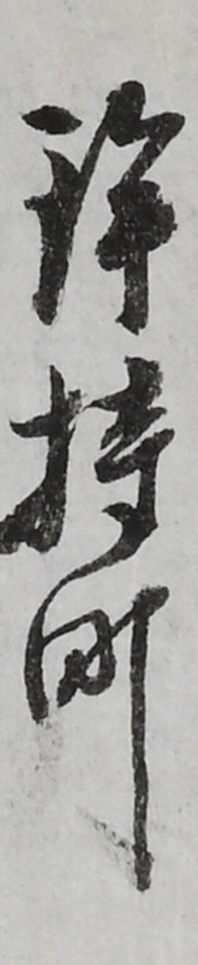鉾持町
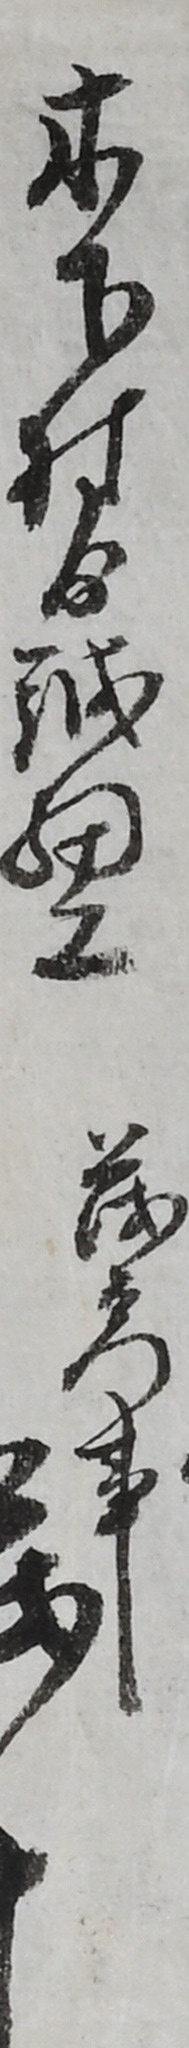木下村分紙細工茂左衛門事
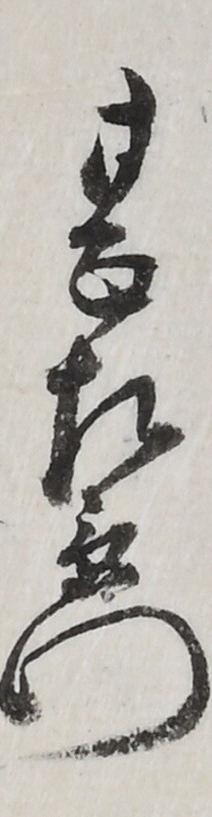甚左衛門

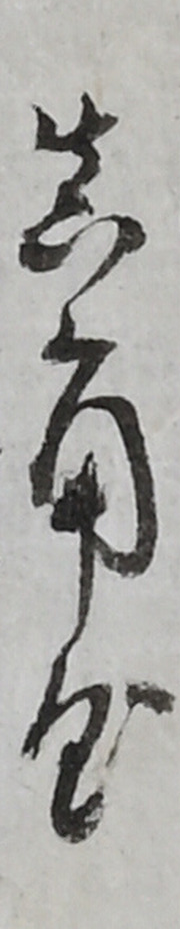真角屋
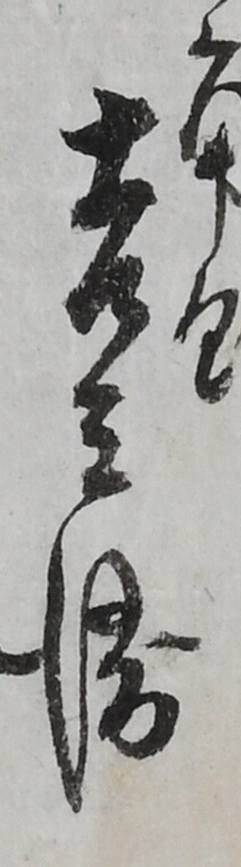吉兵衛
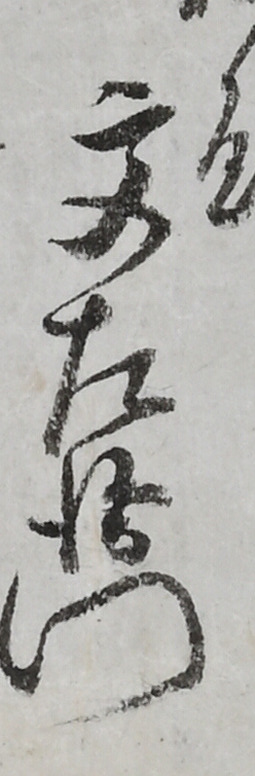文左衛門
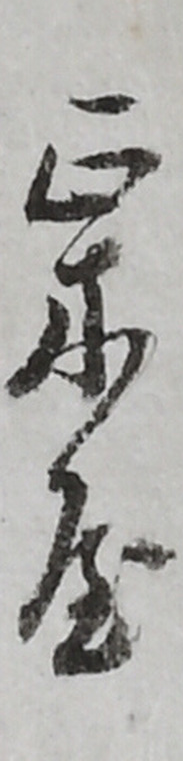正木屋
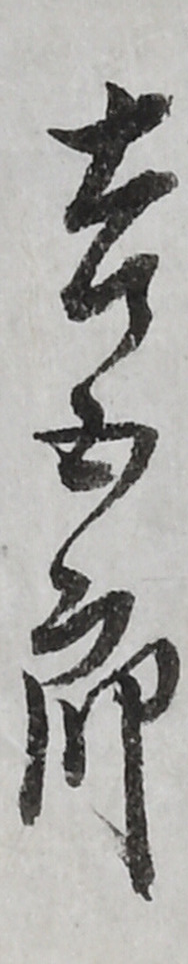吉五郎
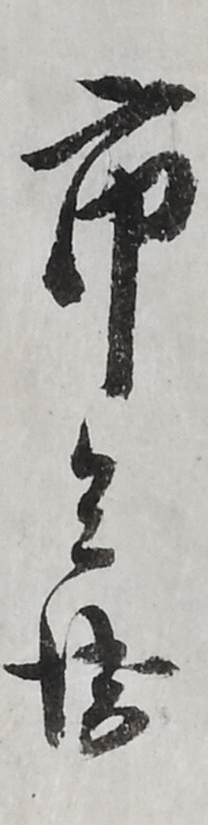吉兵衛

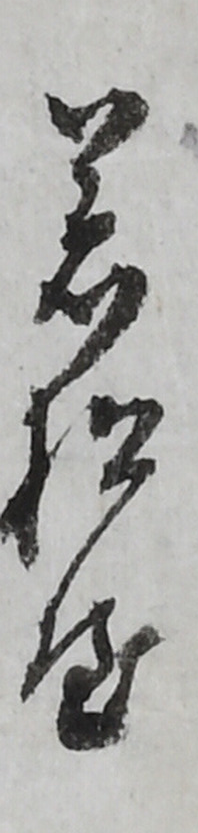若松屋
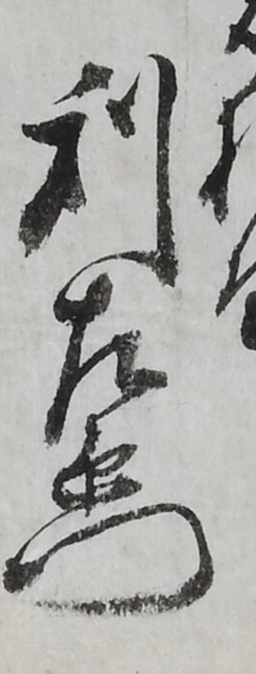利左衛門
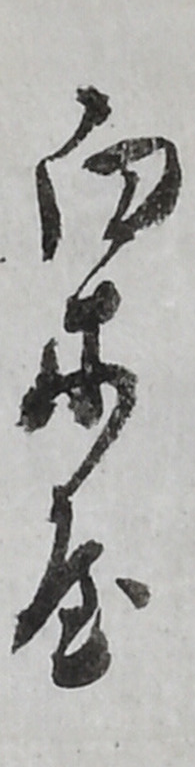白木屋

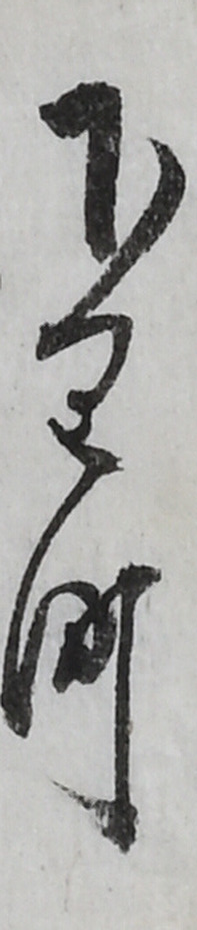下里町
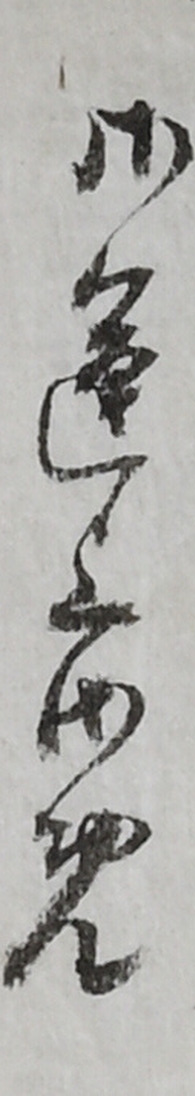御運上御免
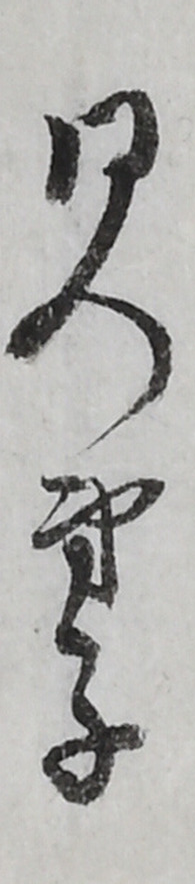同人弟子
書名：年内行事帳
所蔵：伊那市立高遠町図書館・合同会社AMANE
